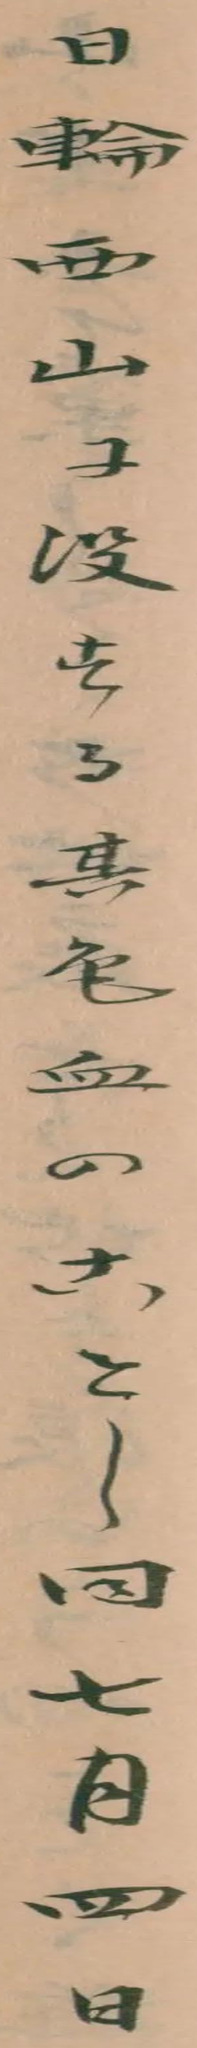日輪西山に没する其色血のことし同七月四日
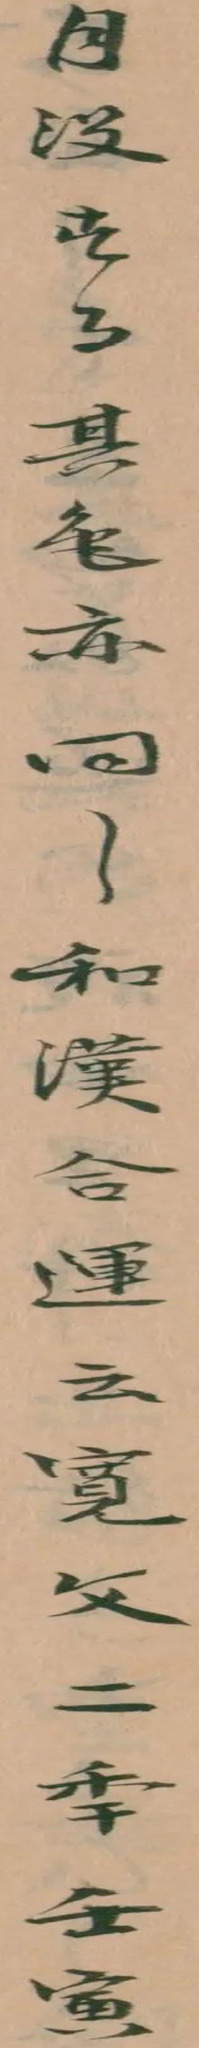月没する其色亦同し和漢合運云寛文二年壬寅
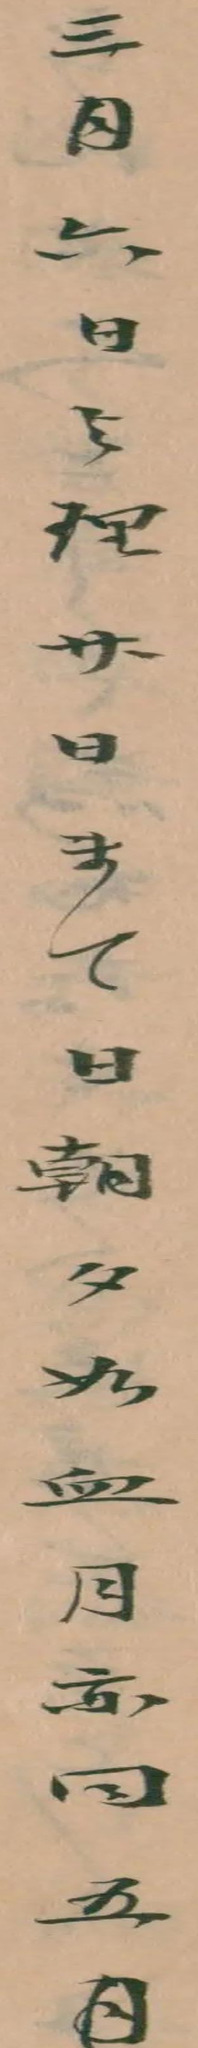三月六日より廿日まて日朝夕如血月亦同五月
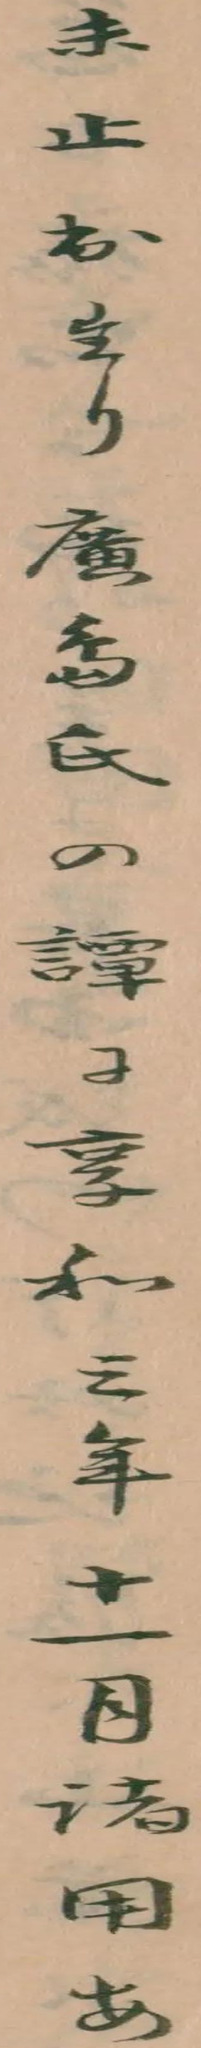末止出たり広島氏の譚に享和三年十一月諸用あ
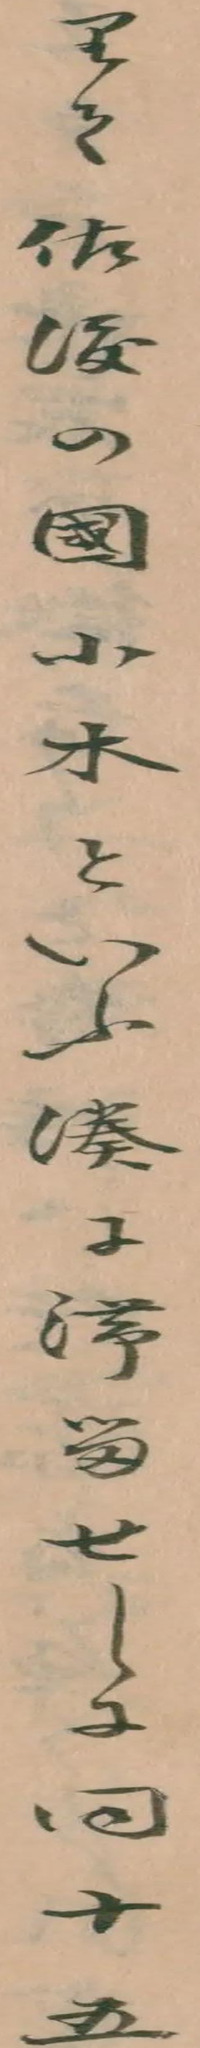りて佐渡の国小木といふ湊に滞留せしに同十五
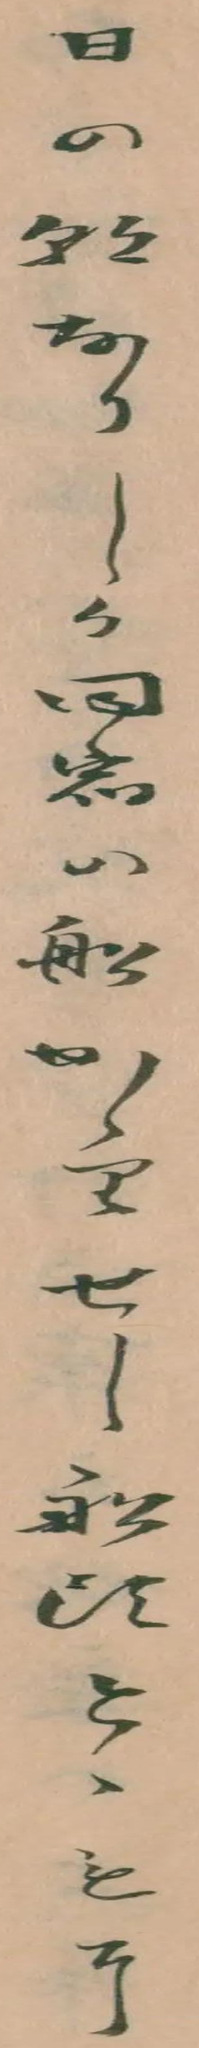日の朝なりしか同宿の船かゝりせし船頭とゝもに
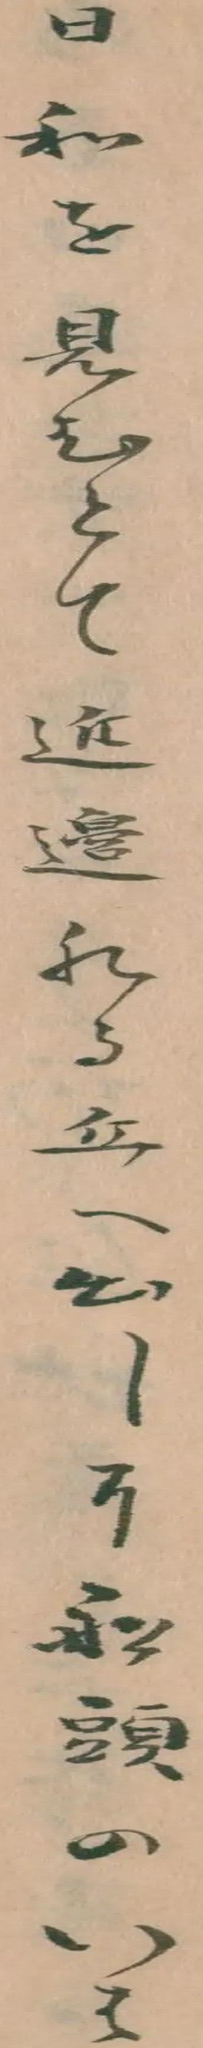日和を見むとて近辺なる丘へ出しに船頭のいは
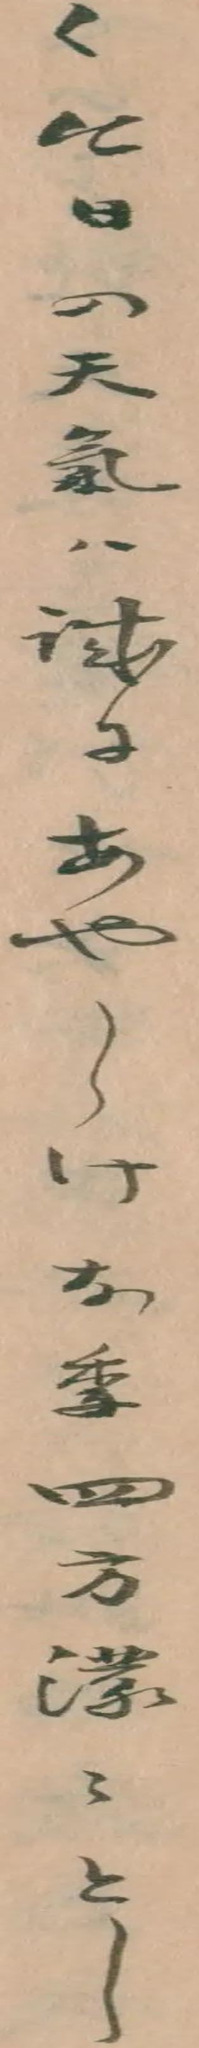く今日の天気は誠にあやしけなり四方濛々とし
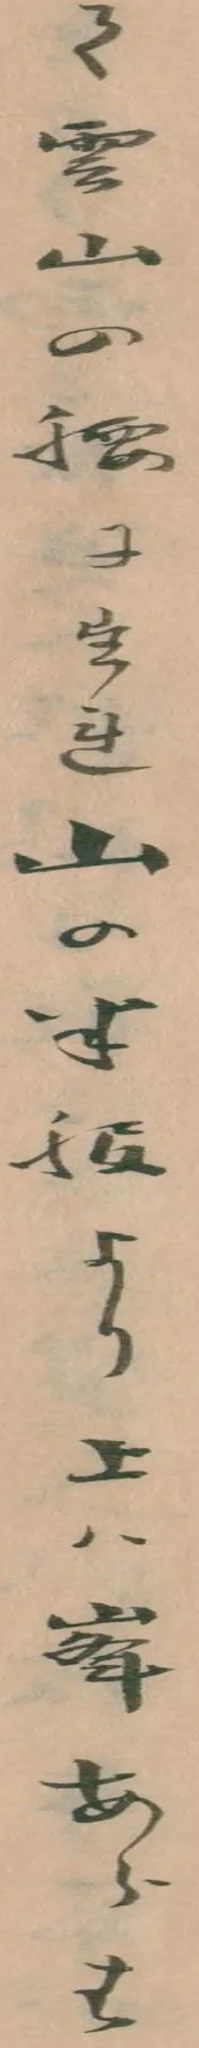て雲山の腰にたれ山の半腹より上は峯あらは

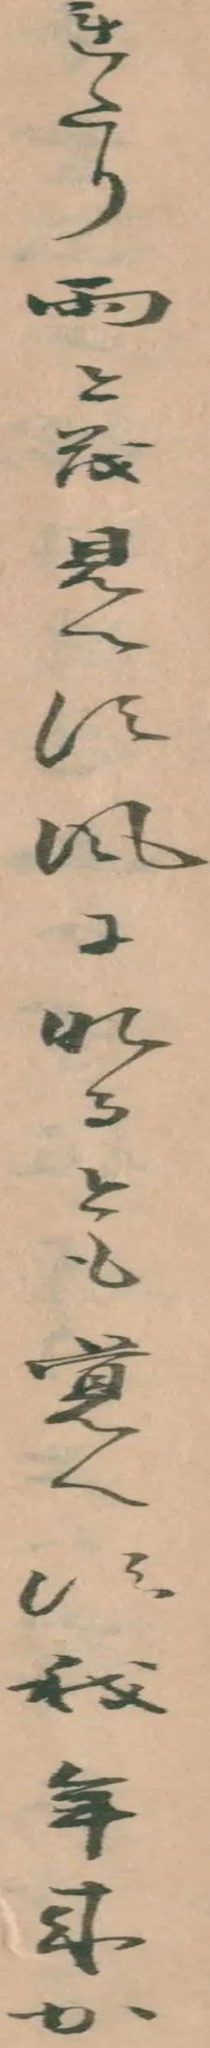れたり雨とも見へす風になるとも覚へす我年来か
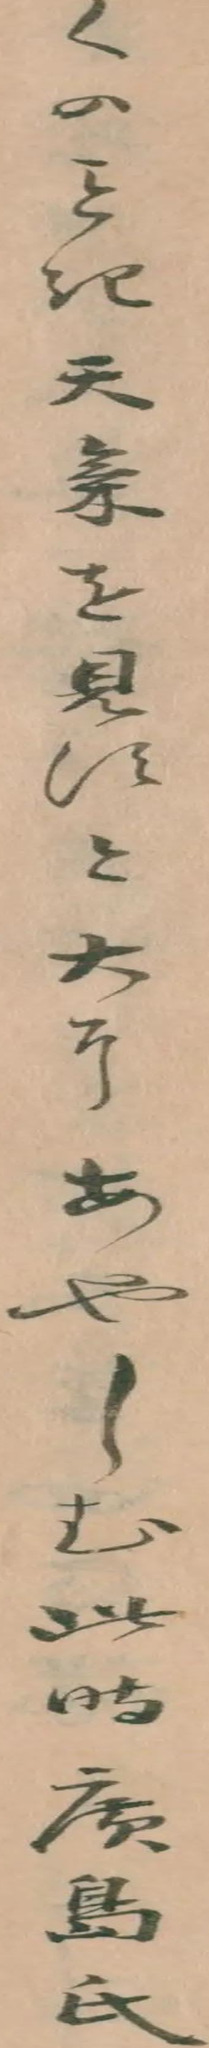くのことき天気を見すと大にあやしむ此時広島氏
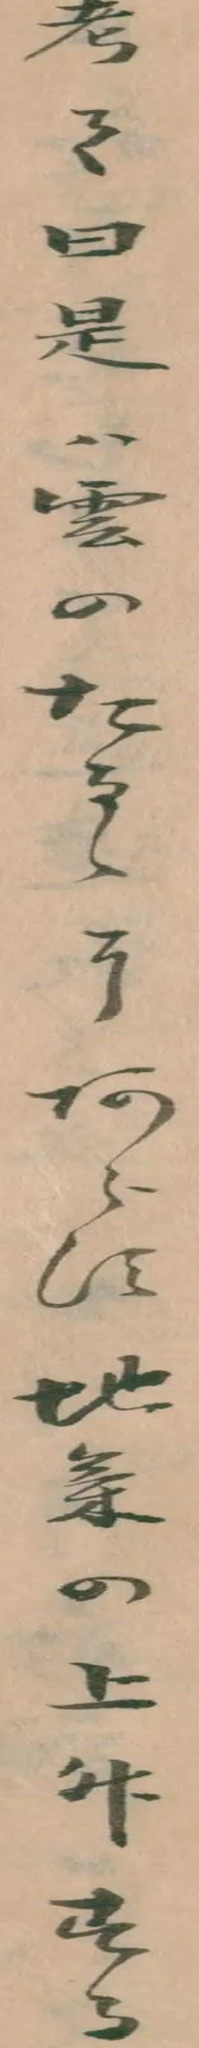考て曰是は雲のたるゝにあらす地気の上昇する
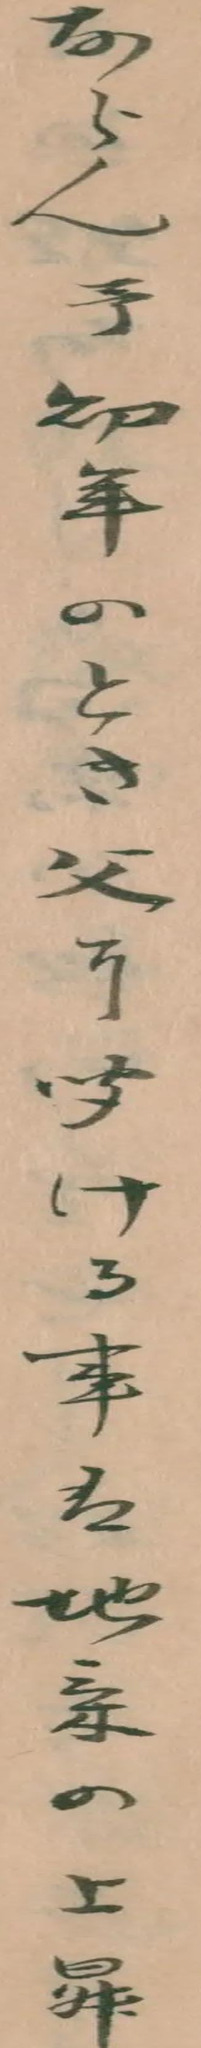ならん予幼年のとき父に聞ける事有地気の上昇
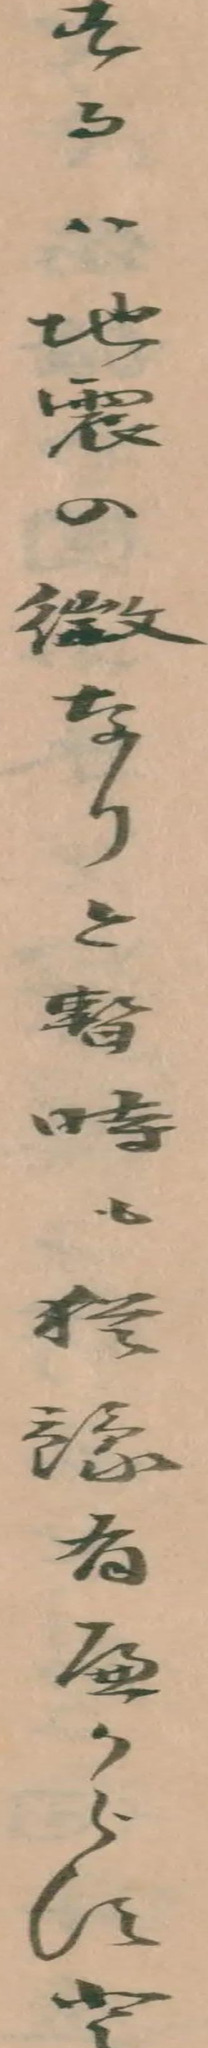するは地震の徴なりと暫時も猶予有へからすと
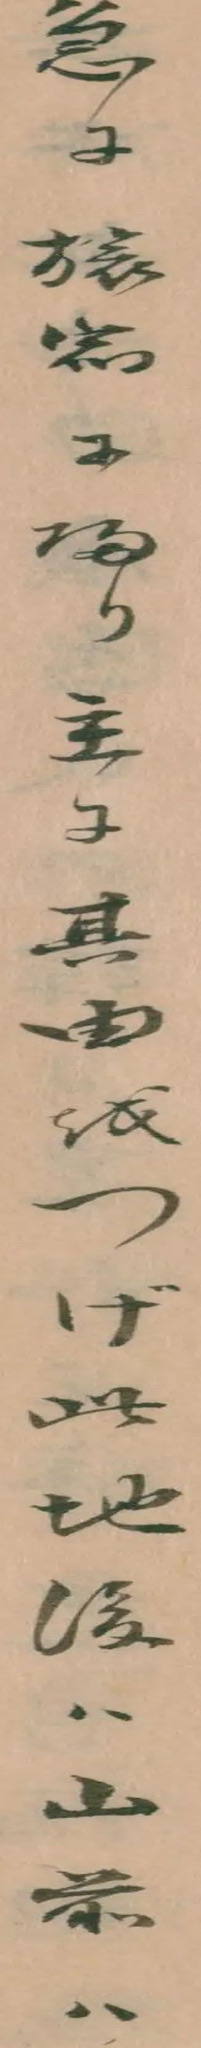急に旅宿に帰り主に其由をつげ此地後は山前は
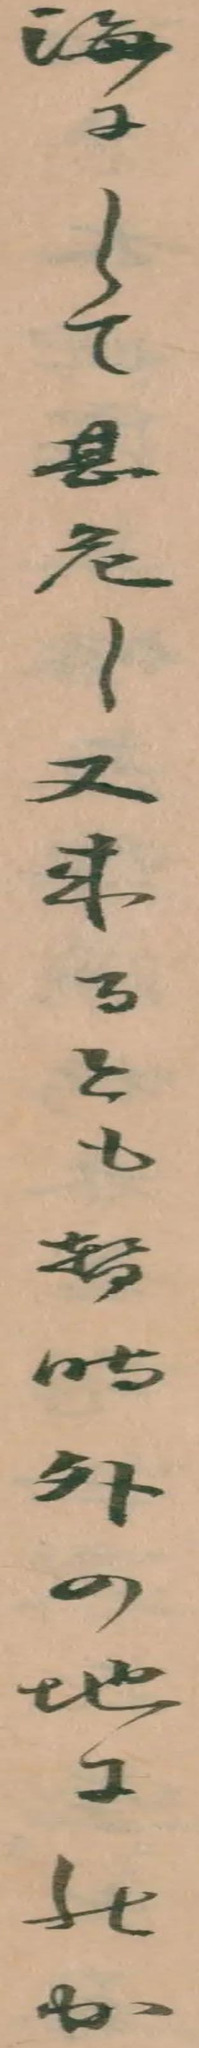海にして甚危し又来るとも暫時外の地にのか
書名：地災撮要. 巻5-6(地震之部)
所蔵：国立国会図書館 National Diet Library, JAPAN
